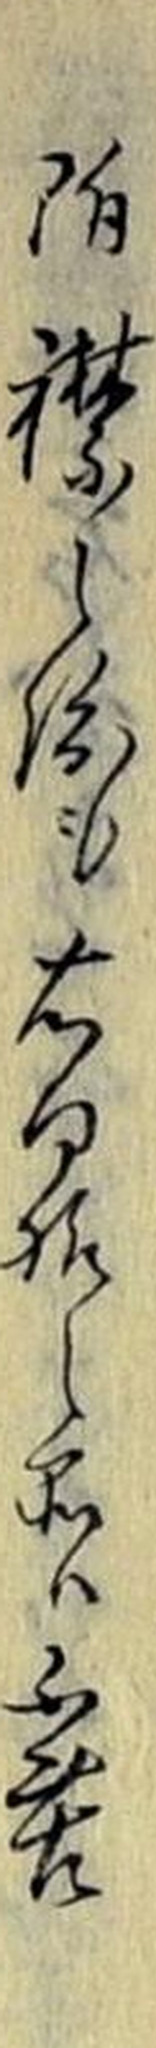附襟之儀も右同様之品は不苦
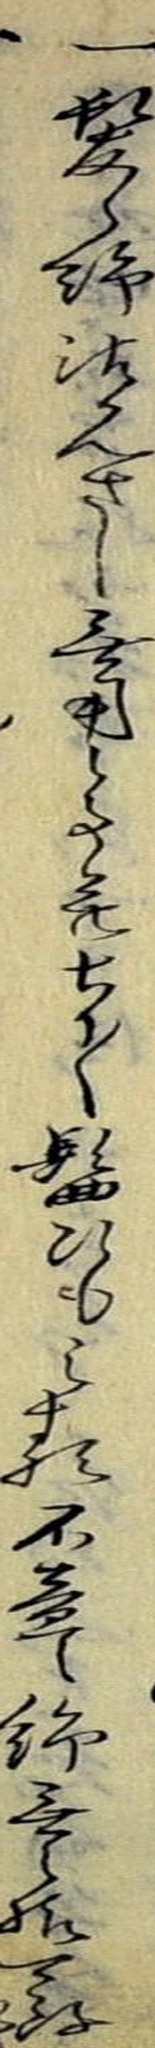一髪之飾銀かんさし無用之事井ちり〳〵髷ひも之類不益之飾無之様可致事
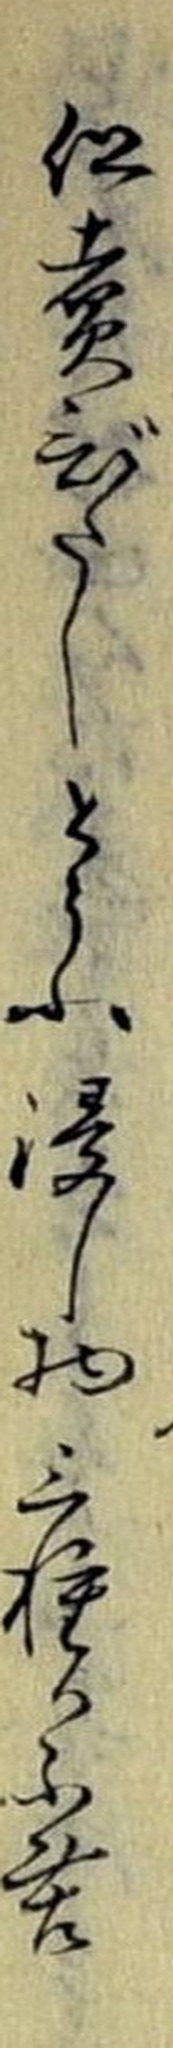但煮びたしとうふ浸し物三種は不苦
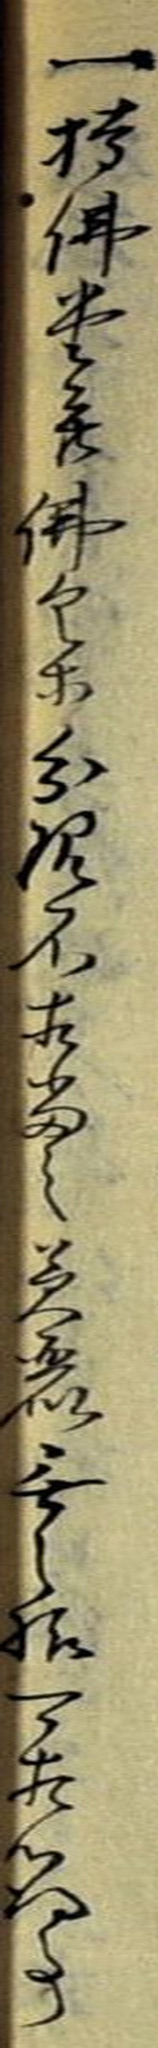一持仏堂井仏具等分限不相当之美麗無之様可相心得事
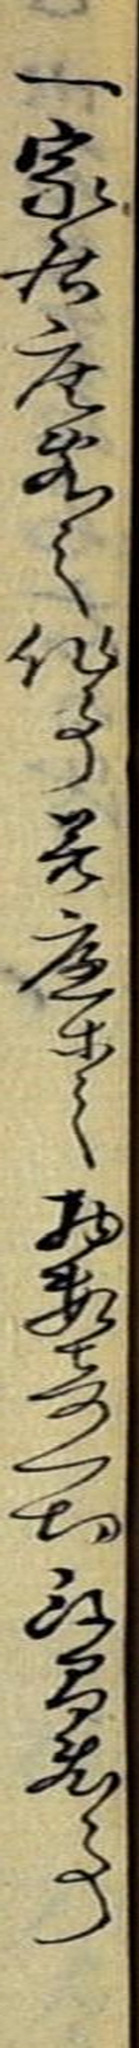一家居座敷之作事井庭等物数気一切致間敷事
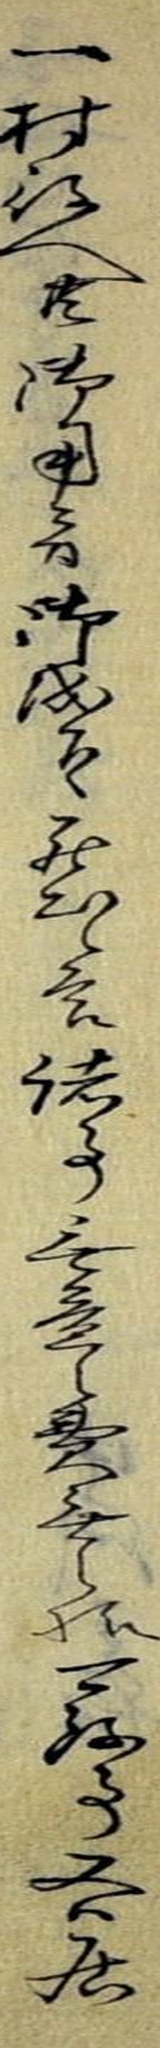一村役人共御用に而御城下へ罷出候節諸事無益之費無之様可致事又は居
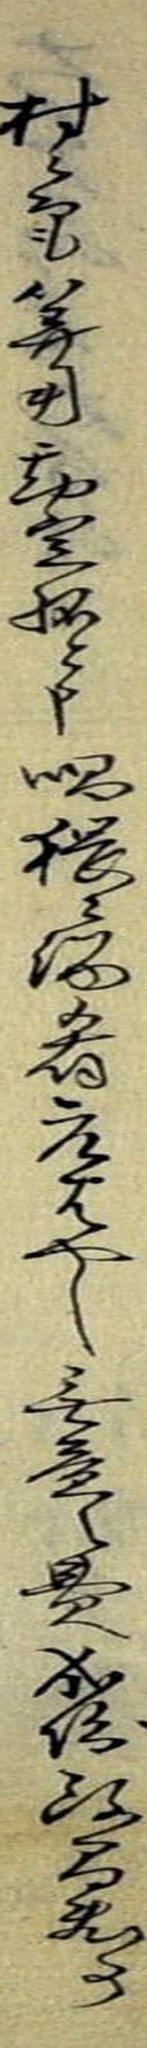村に而も算用勘定抔と申唱猥に酒肴取はやし無益之費成儀致間敷事
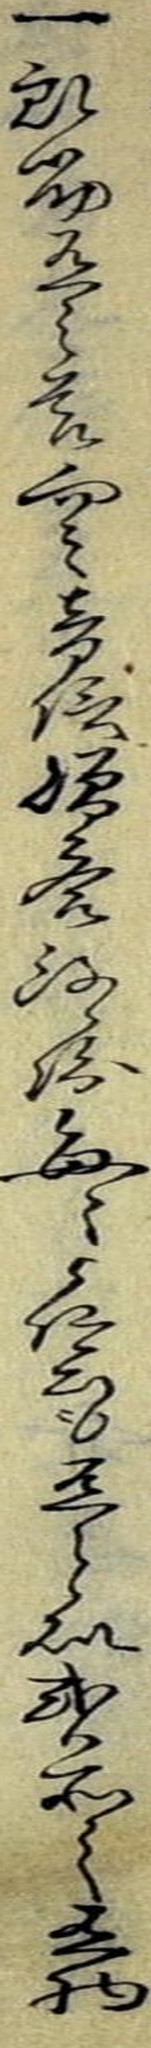一願筋有之節は向々へ音信贈答致候儀毎々被仰出も有之候処或は所々之有物
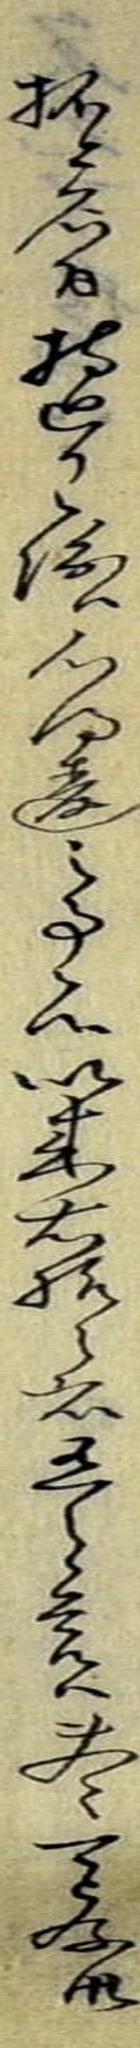抔と名付持廻候儀は心得違之事に候以來右様之者有之候節は夫々可被及御
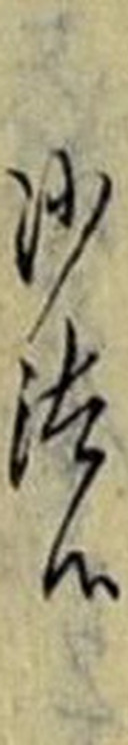沙汰候
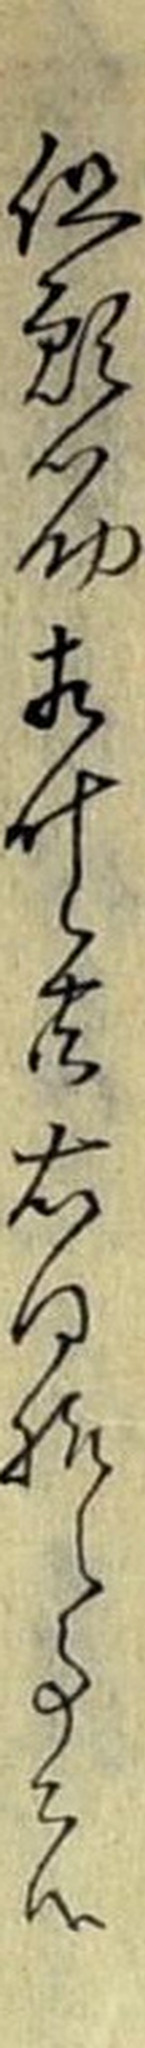但願筋相叶候共右同様之事に候
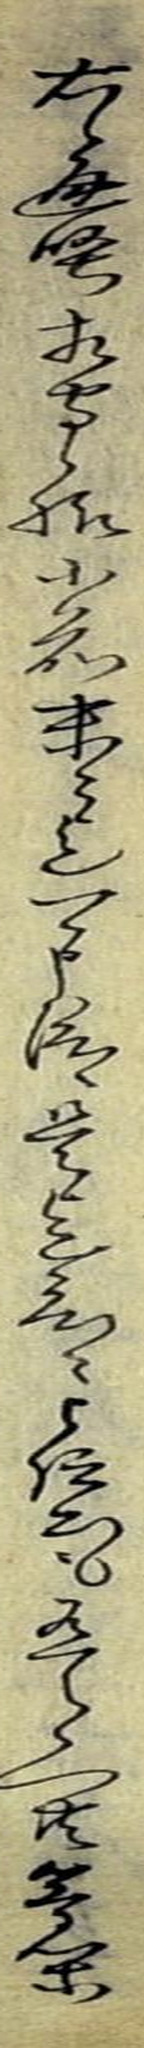右之通堅相守候様小前末々迄可申渡候是迄度々被仰出候も有之候へ共等閑
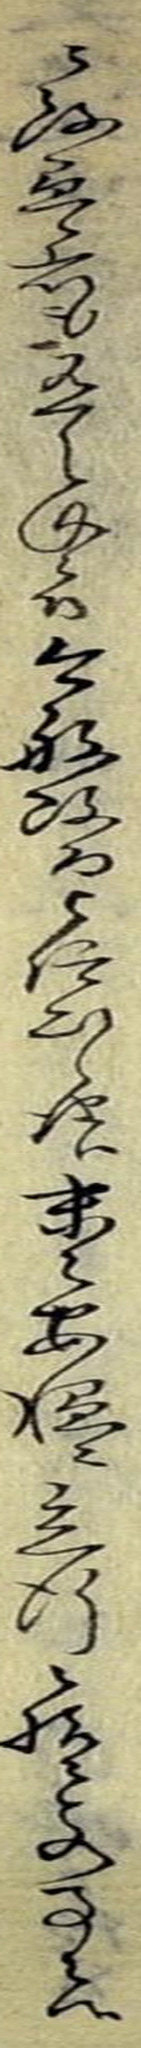に致置候も有之趣に付今般改而被仰出候儀は末々安穏に立行候様にとの事に候
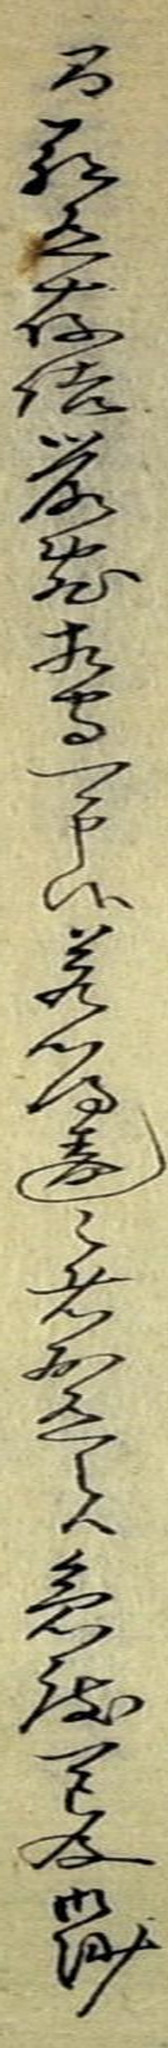間難有存詰厳重相守可申候若心得違之者於有之は急度可被及御沙
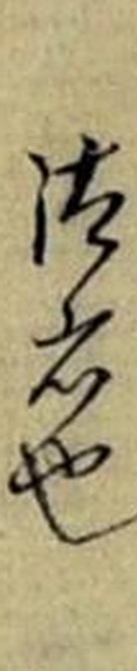汰者也
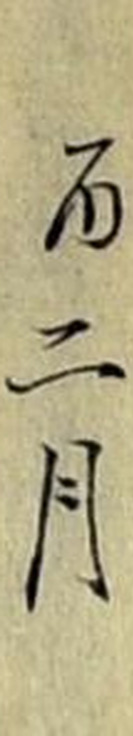酉二月
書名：命令之部 六
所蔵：福井県文書館 Fukui Prefectural Archives
